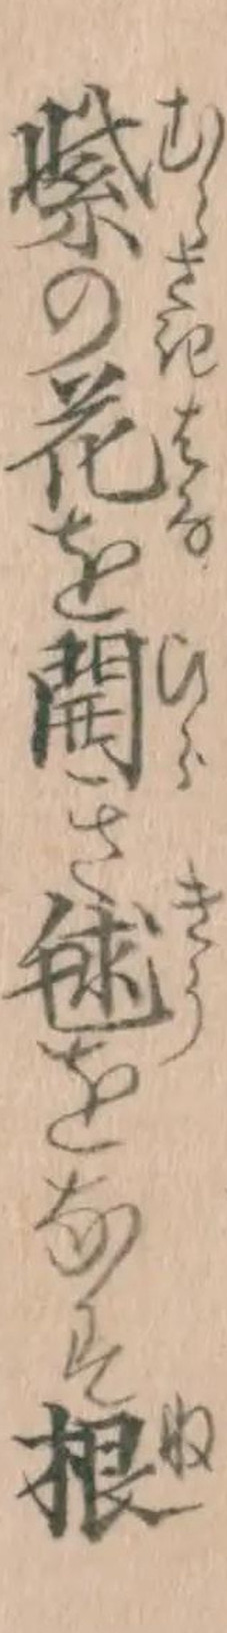紫の花を開き毬をなす根
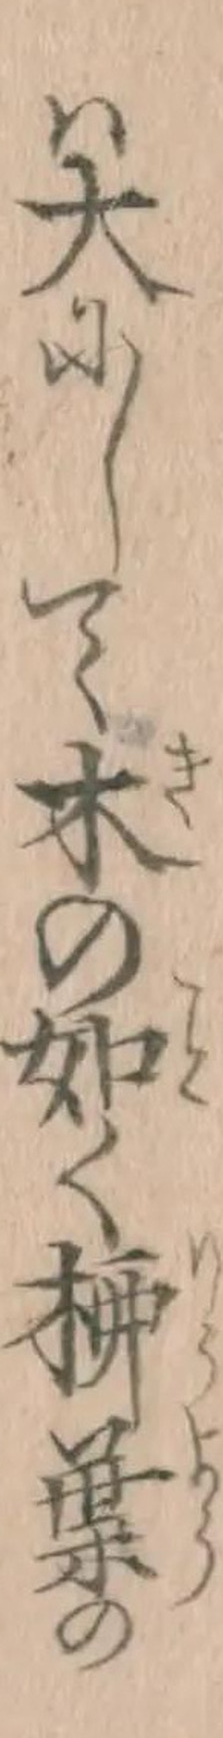は大にして木の如く柳葉の
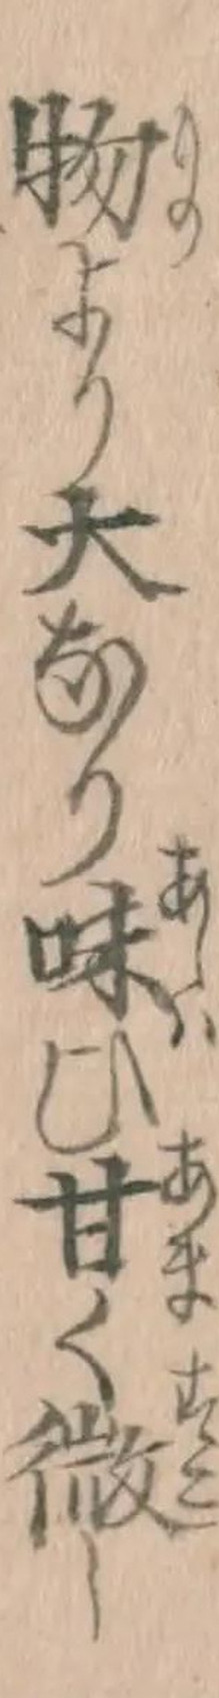物より大なり味ひ甘く微し

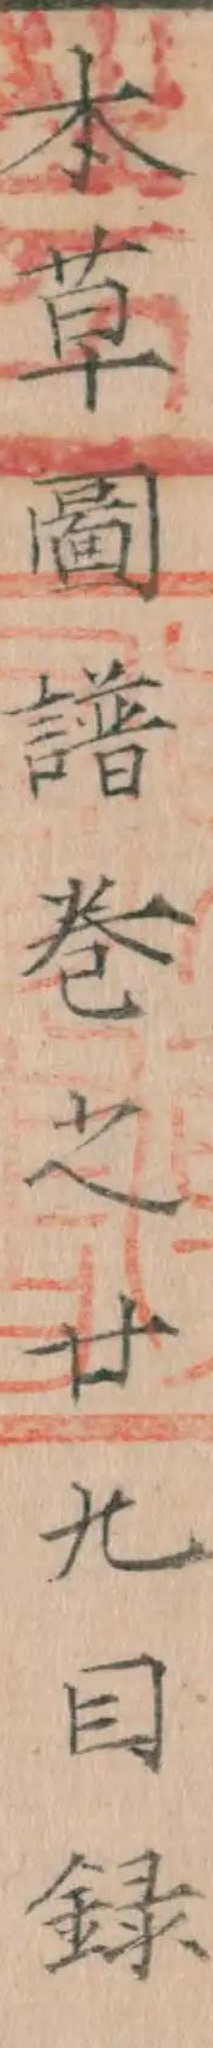本草図譜巻之廿九目録
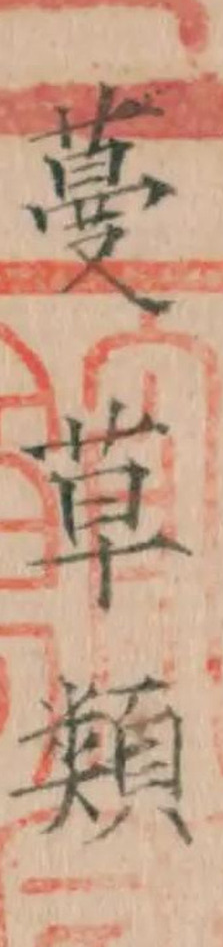蔓草類

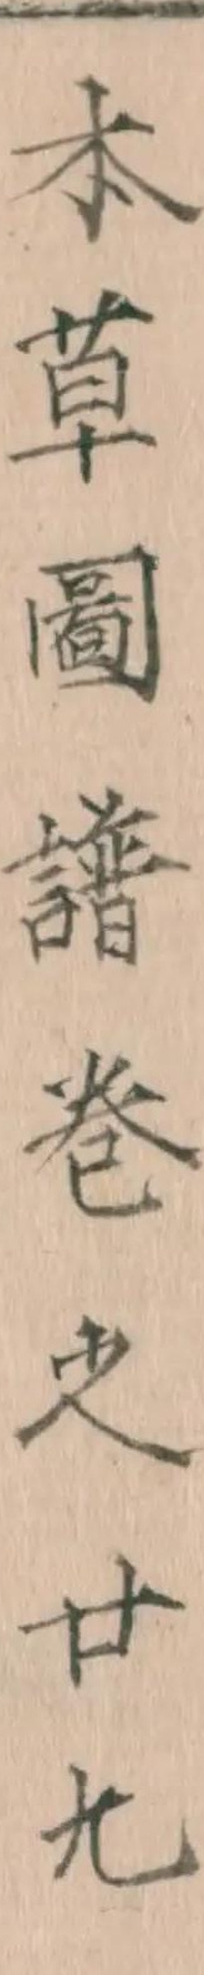本草図譜巻之廿九
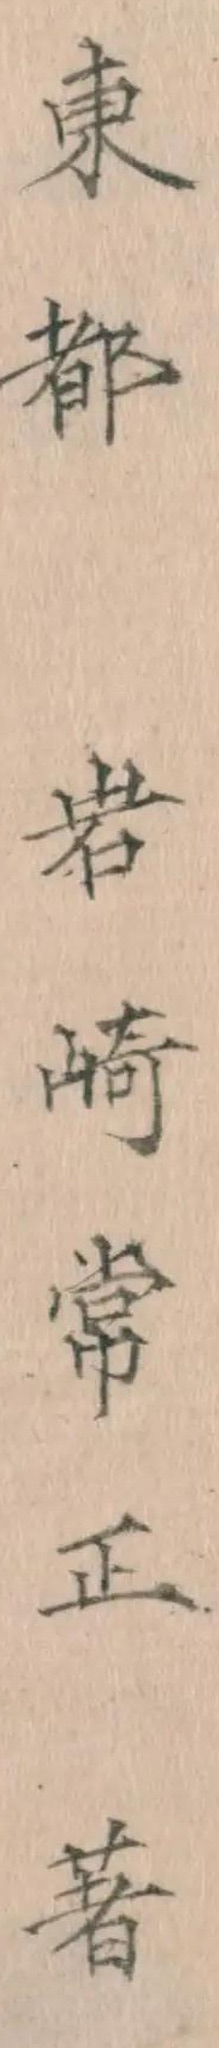東都岩崎常正著
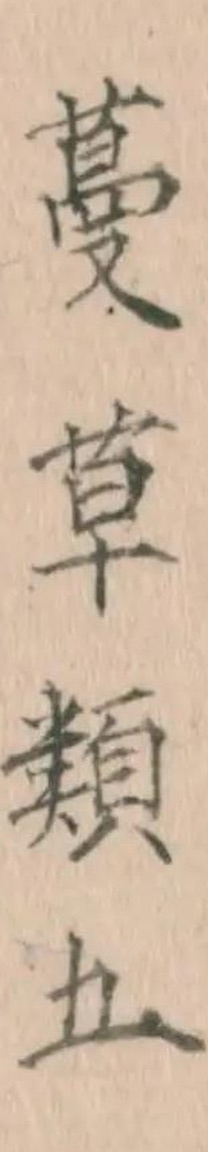蔓草類五

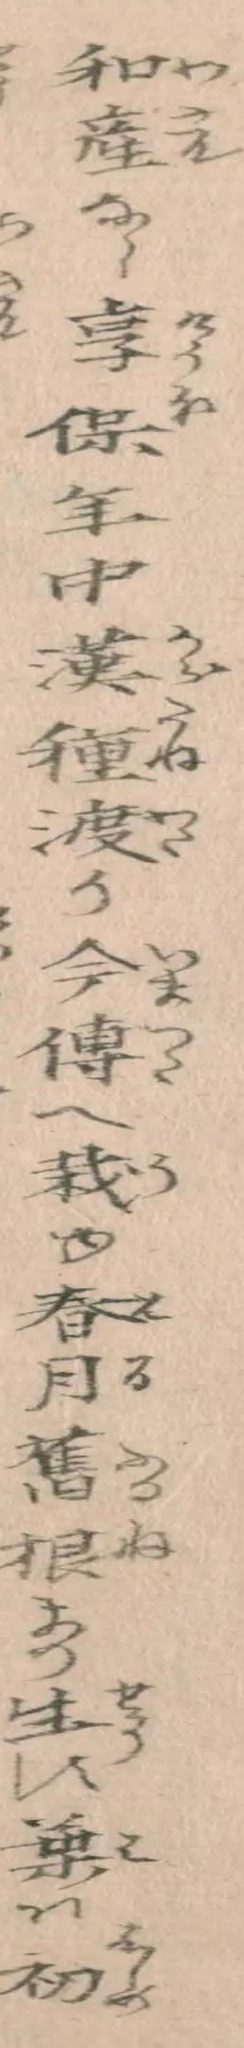和産なし享保年中漢種渡り今伝へ栽ゆ春月旧根より生す葉は初
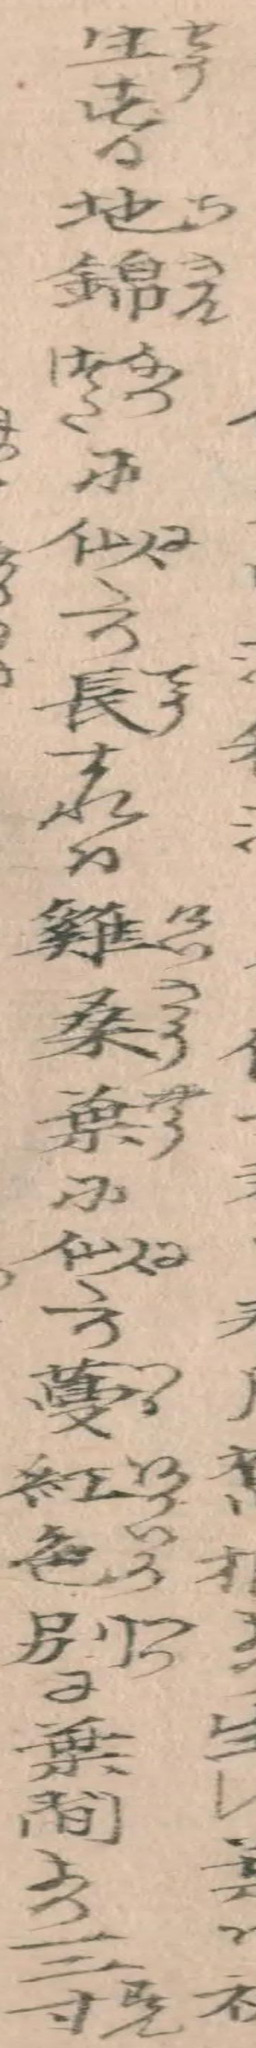生する地錦なつつたに似たり長すれは鶏桑葉に似たり蔓紅色別に葉間より一二寸
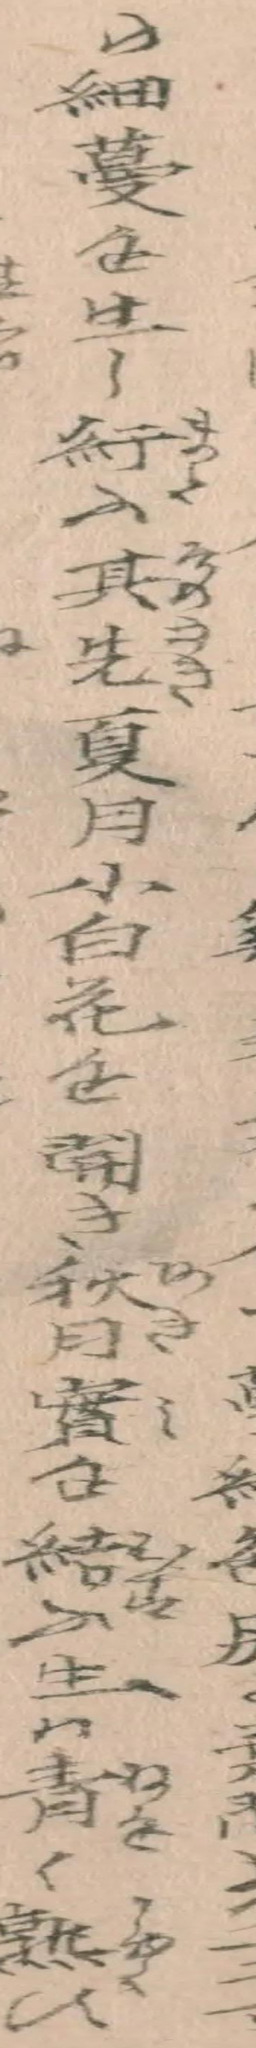の細蔓を生し紆ふ其先夏月小白花を開き秋月実を結ふ生は青く熟す
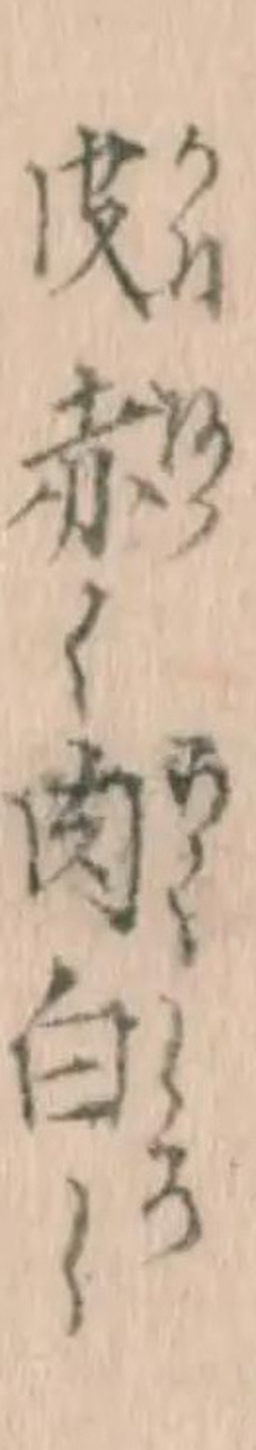皮赤く肉白し

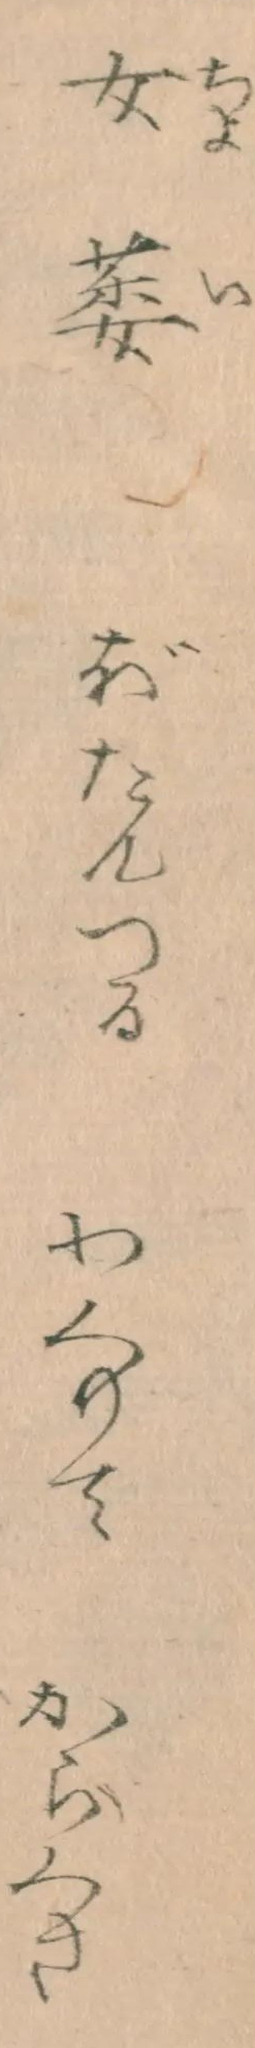女萎ぼたんつるわくのてからくさ
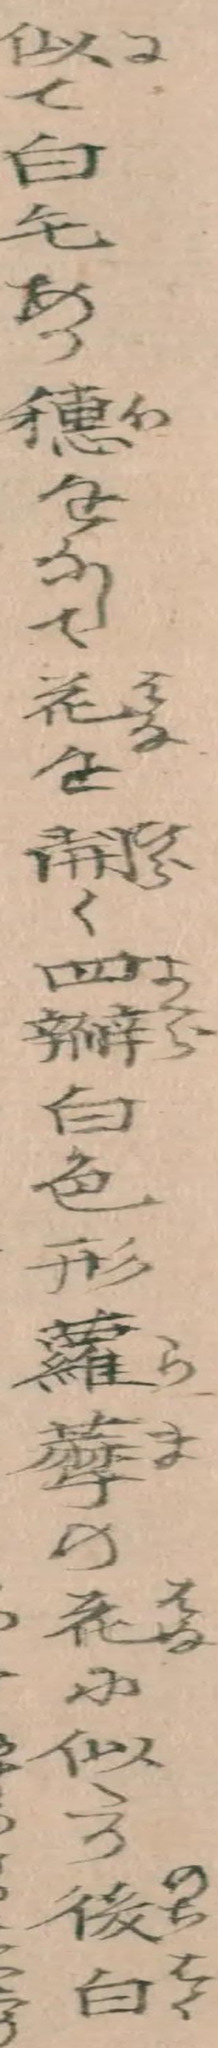似て白毛あり穂をなして花を開く四弁白色形蘿藦の花に似たり後白

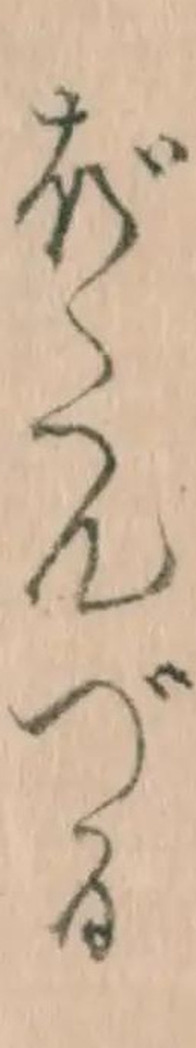ぼたんづる

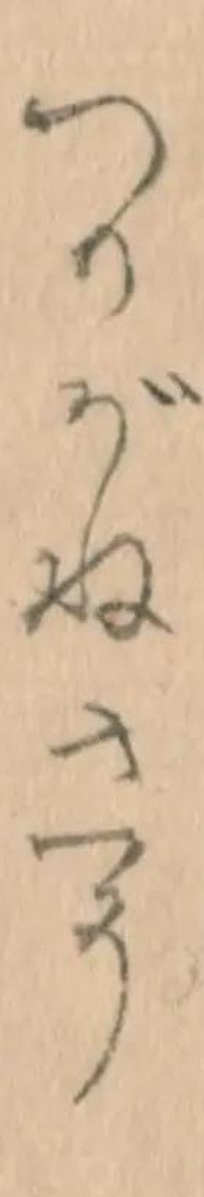つりがねさう
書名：本草図譜. 巻28-30
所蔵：国立国会図書館 National Diet Library, JAPAN
